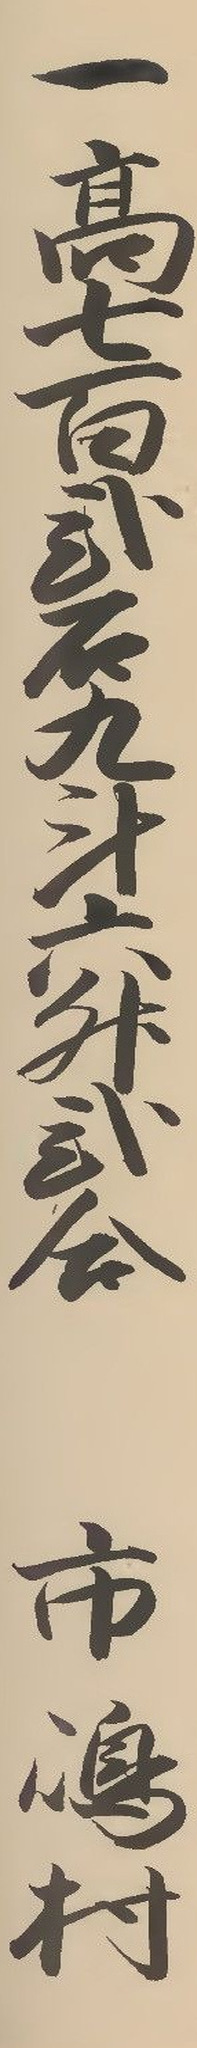一高七百弐石九斗六升弐合市島村
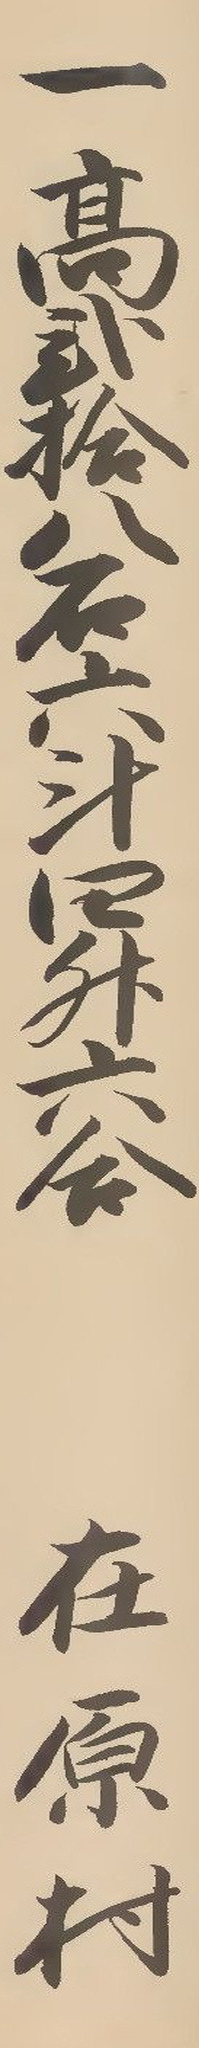一高弐拾八石六斗四升六合在原村
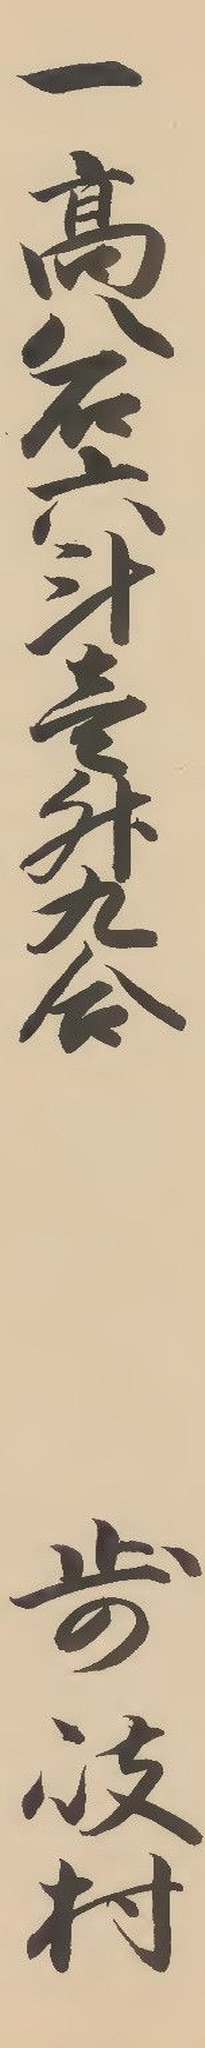一高八石六斗壱升九合歩岐村
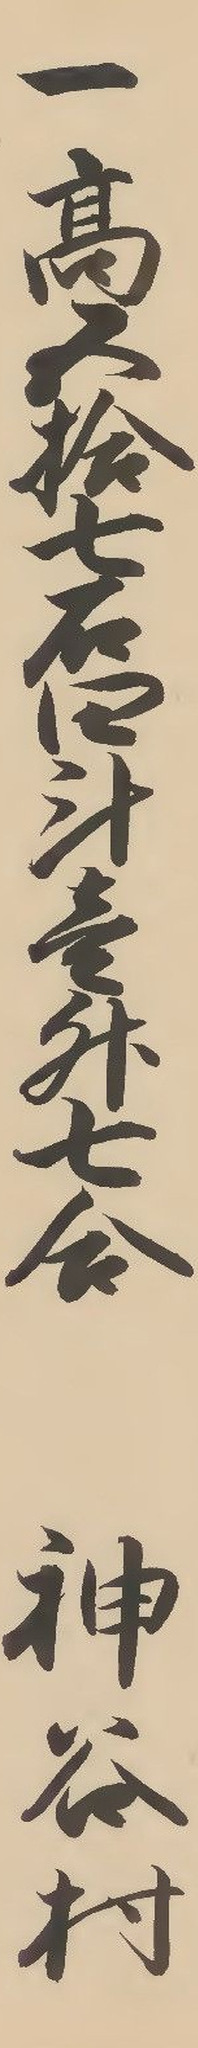一高五拾七石四斗壱升七合神谷村
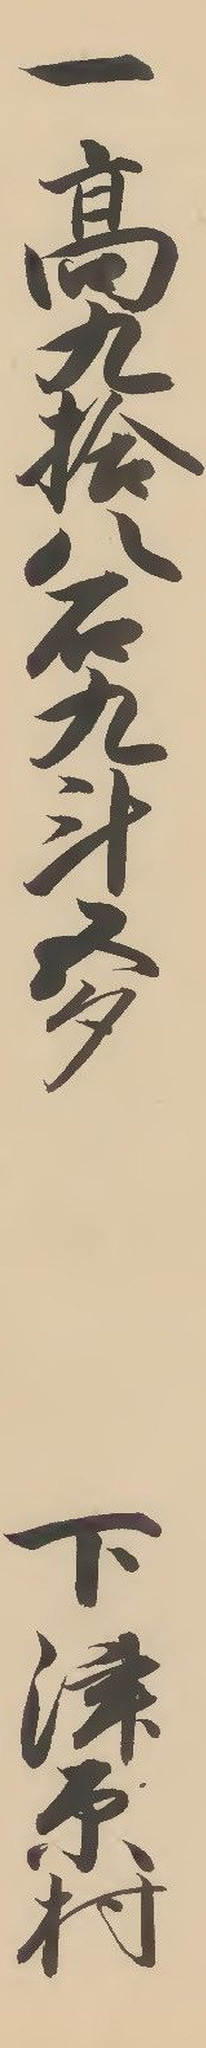一高九拾八石九斗五勺下津原村

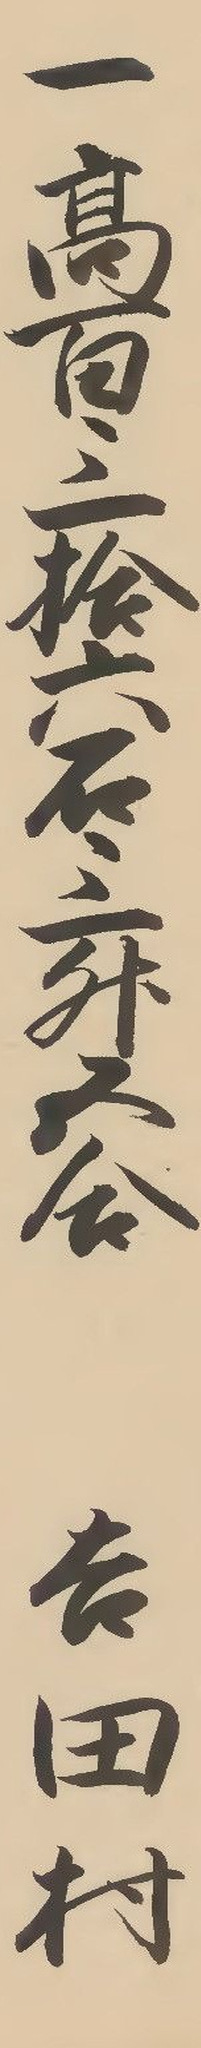一高百三拾六石三升五合吉田村
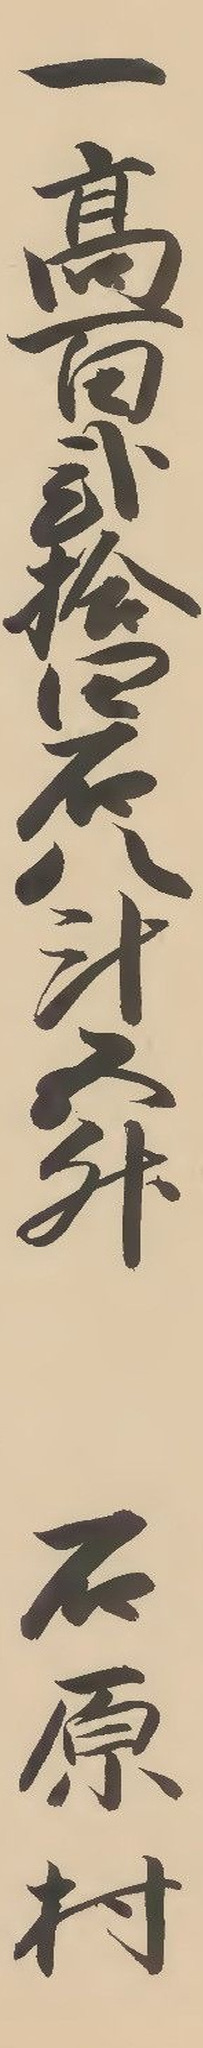一高百弐拾四石八斗五升石原村
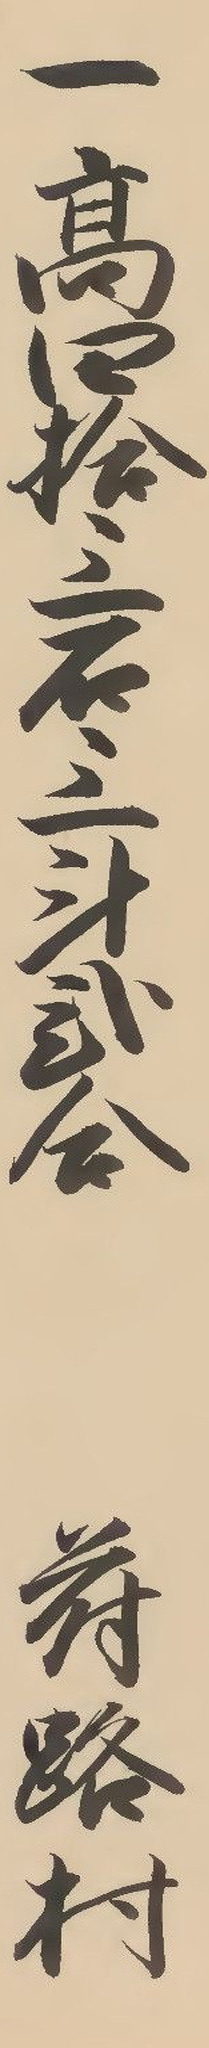一高四拾三石三斗弐合苻路村
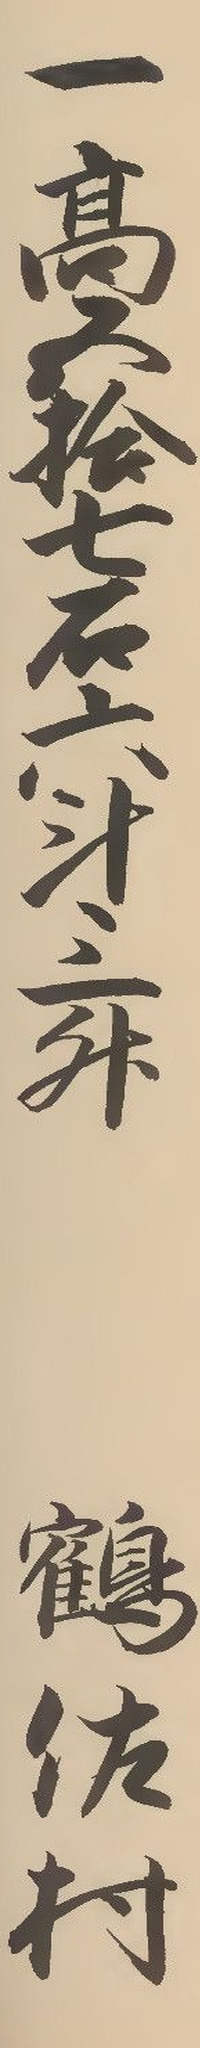一高五拾七石六斗三升鶴佐村
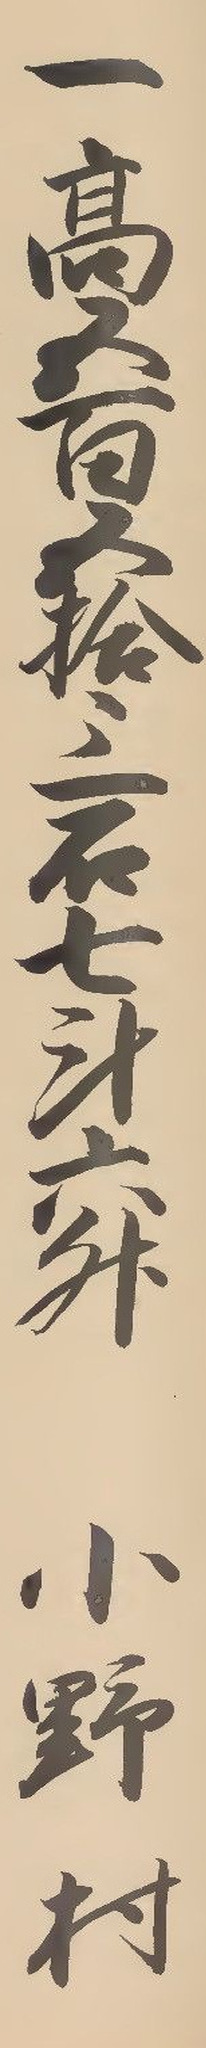一高五百五拾三石七斗六升小野村
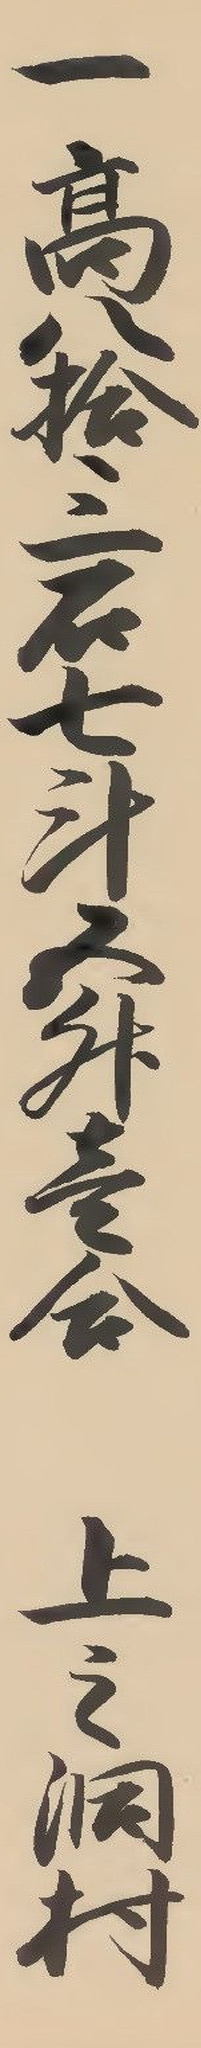一高八拾三石七斗五升壱合上之洞村
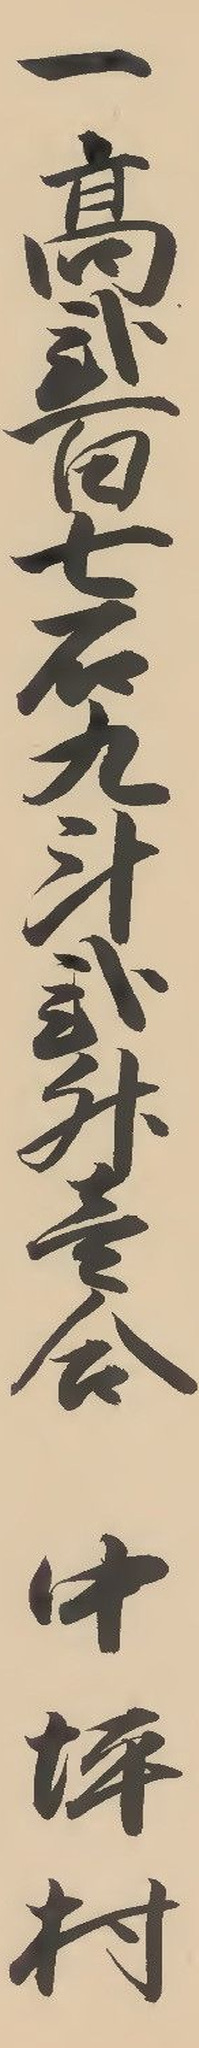一高弐百七石九斗弐升壱合中坪村
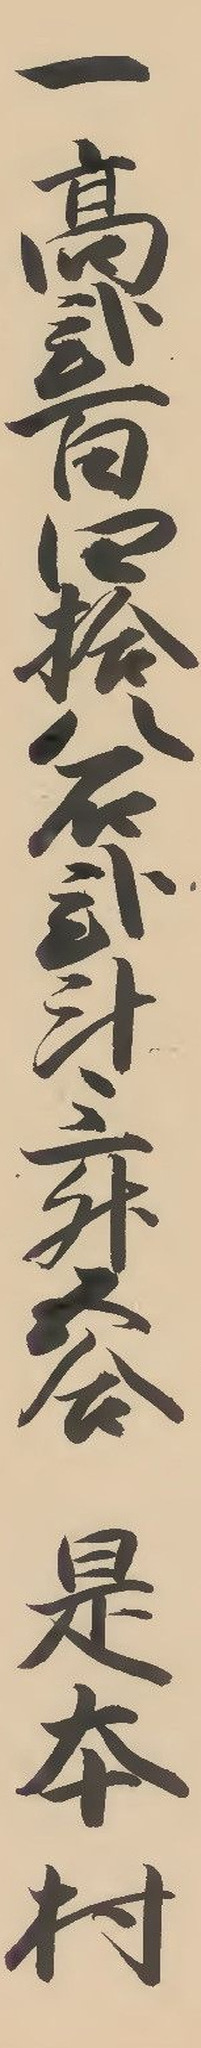一高弐百四拾八石弐斗三升五合是本村

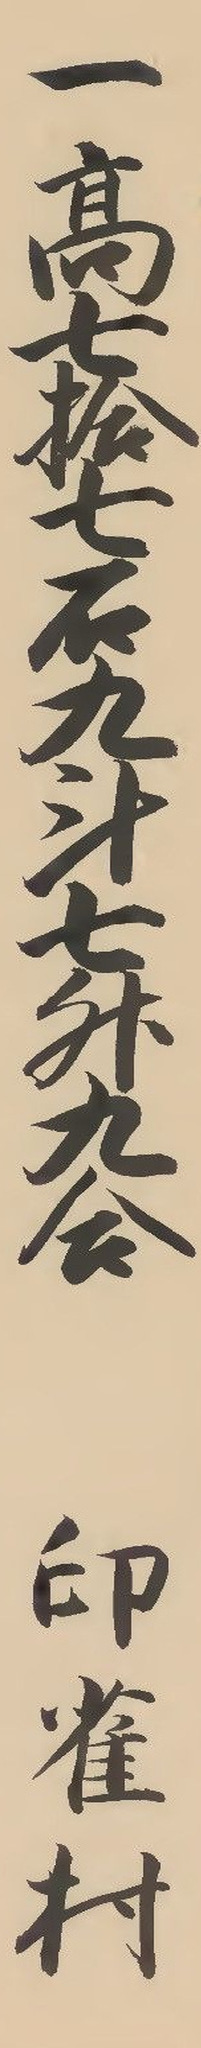一高七拾七石九斗七升九合印雀村
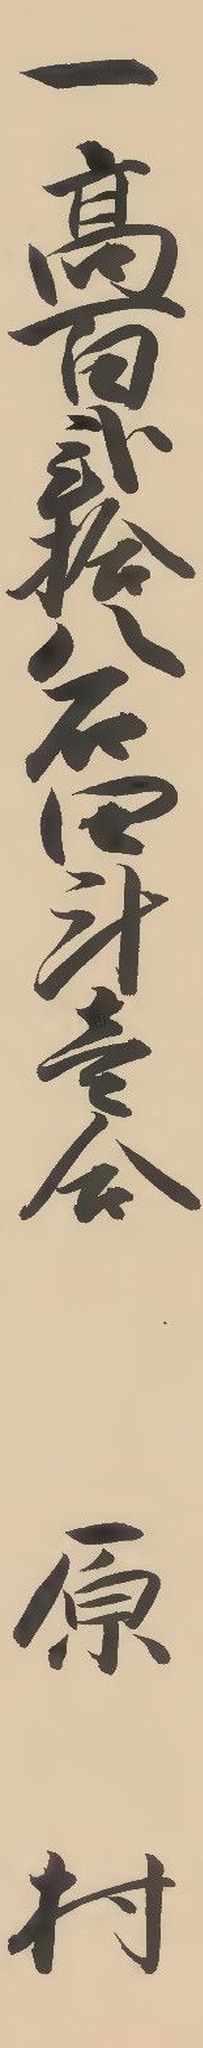一高百弐拾八石四斗壱合原村
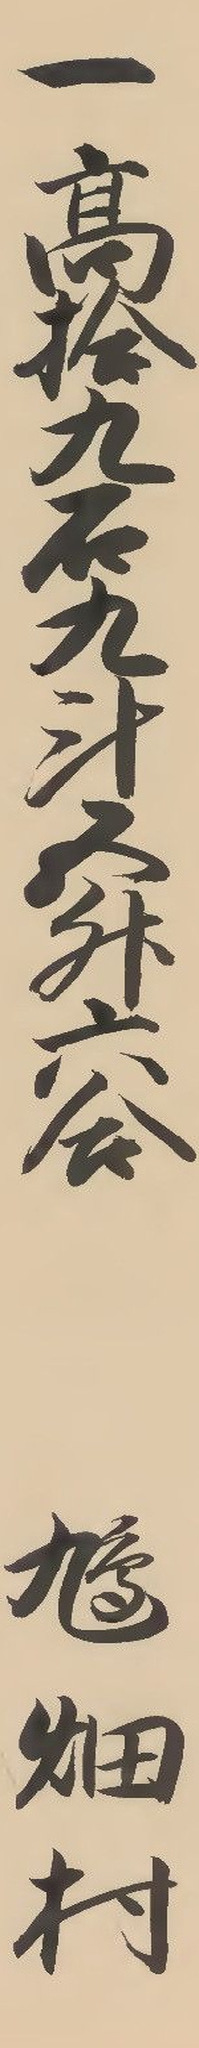一高拾九石九斗五升六合鳩畑村
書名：美濃国郷帳
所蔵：国立公文書館 National Archives of Japan
